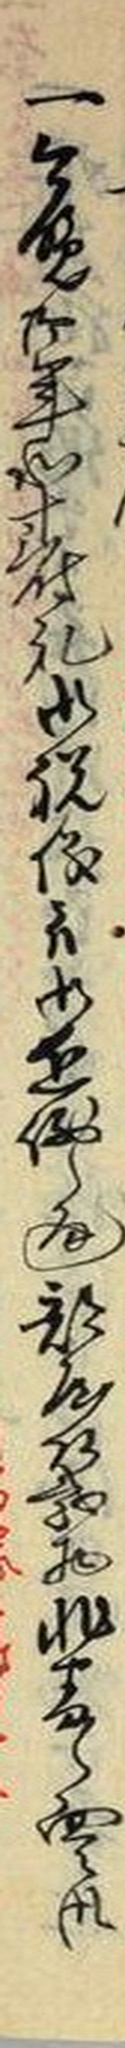一今晩御年わすれ御祝儀ニ付御近例之通部屋頂戴物非番之面々御
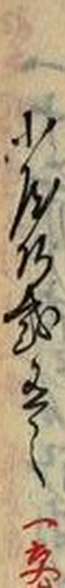小屋頂戴有之
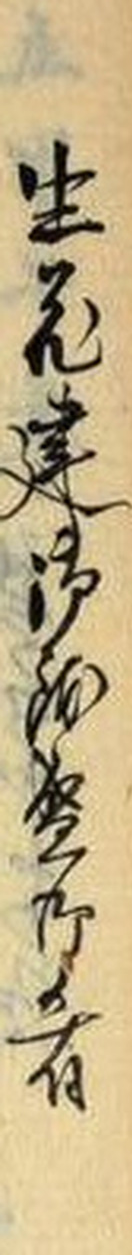生花建御鉢盛御肴
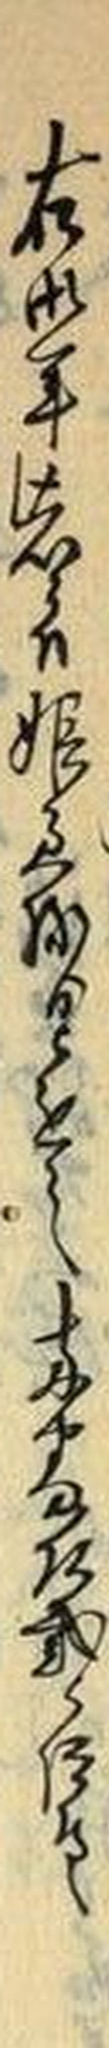右御年忘ニ付姫君様ゟ被進之両番頂戴被仰付候
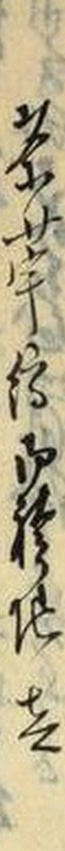茶苧縞御袴地壱
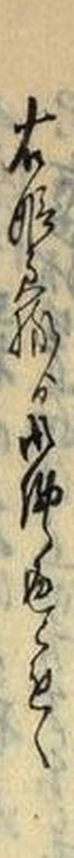右姫君様ゟ御例之通被進之
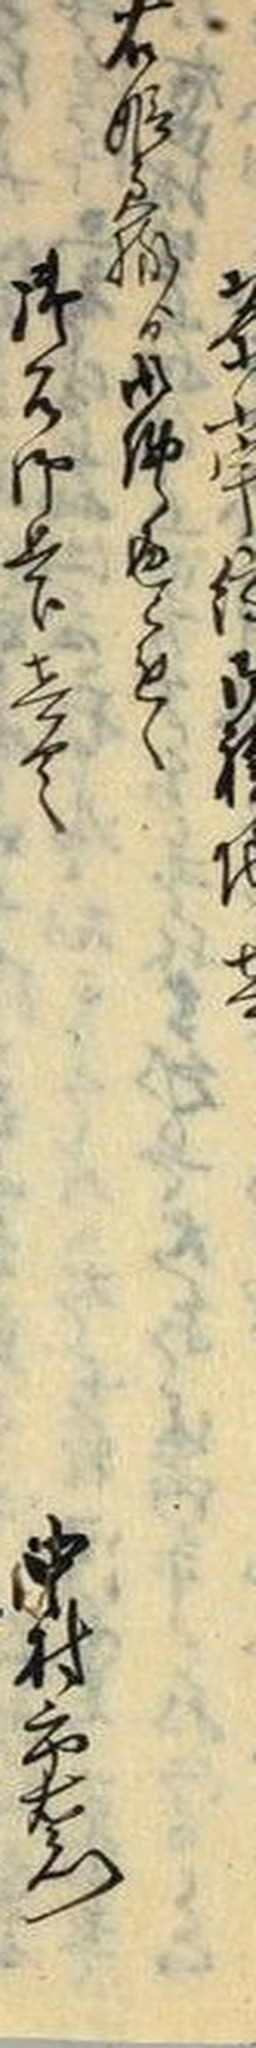御召御上下壱具中村市右衛門
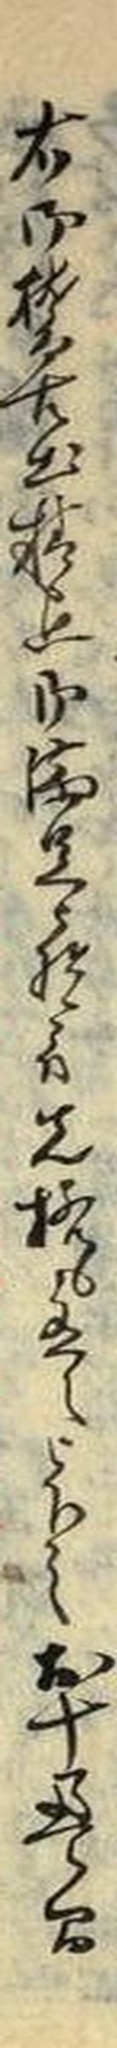右御稽古出精申上御満足被遊候ニ付先格も有之被下之於十畳之間
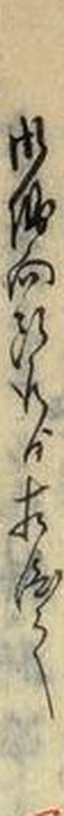御側向頭取ゟ相渡之
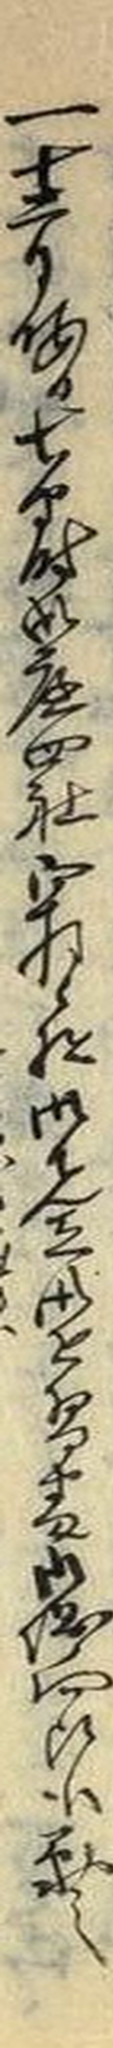一十二月晦日七半時御庭四社御拝被遊御先立御近習番御側向頭取勤之
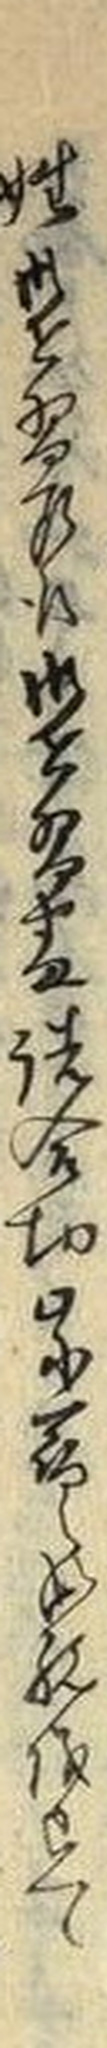姓御近習頭取御近習番詰合切歳暮之御祝儀申上候
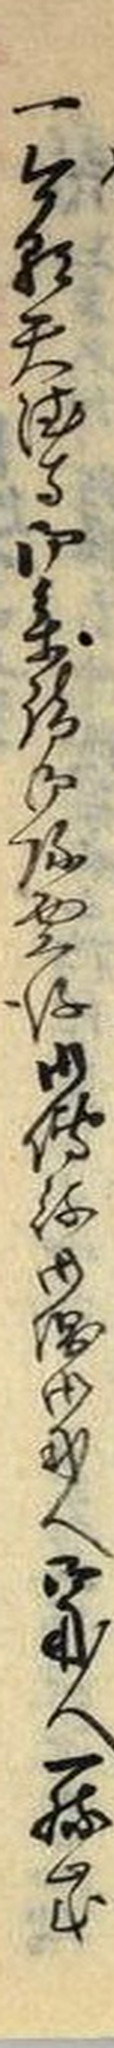一今朝天徳寺御参詣御帰殿後御傅役御側御用人御用人一統歳
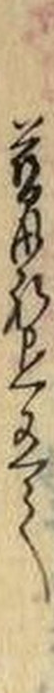暮御礼申上有之
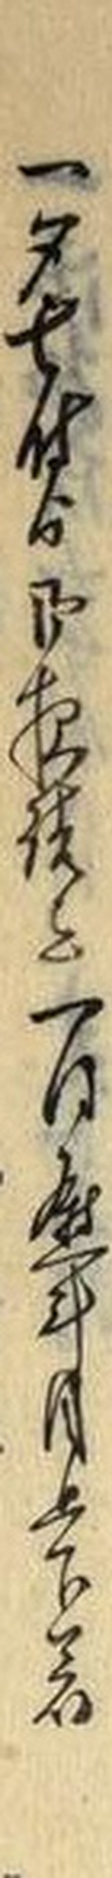一夕七時ゟ御夜詰迄一同熨斗目上下着

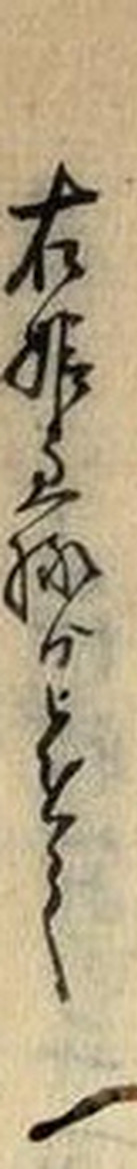右姫君様ゟ被進之
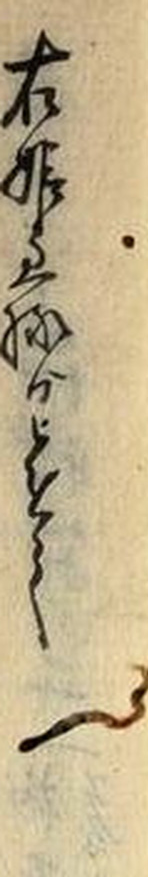右姫君様ゟ被進之
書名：少傅日録抄（斉承付側向頭取日記、在府）
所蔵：福井県文書館 Fukui Prefectural Archives
